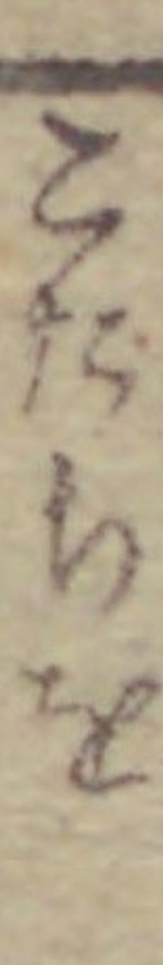こたちを
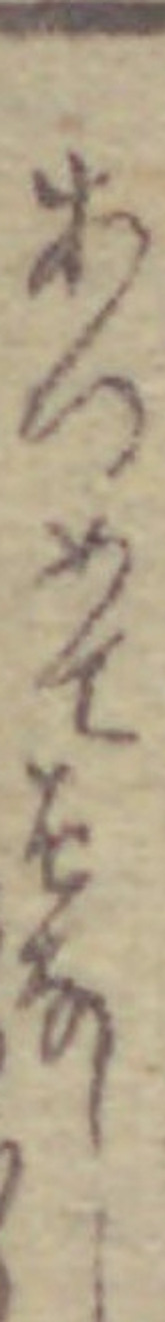あつめてはなし
